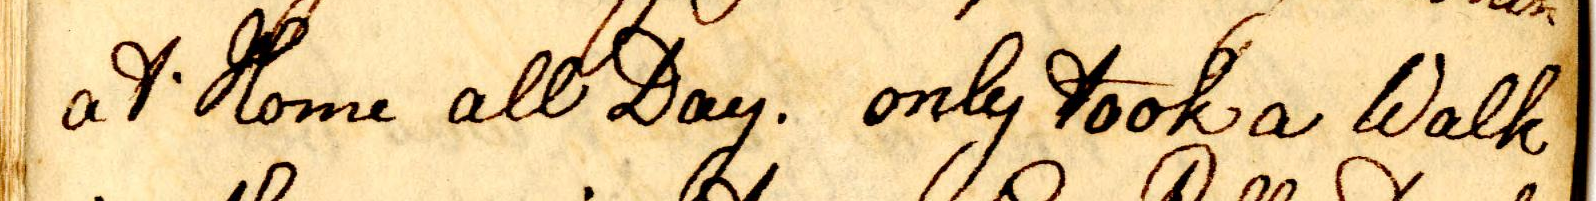at Home all Day. only took a Walk
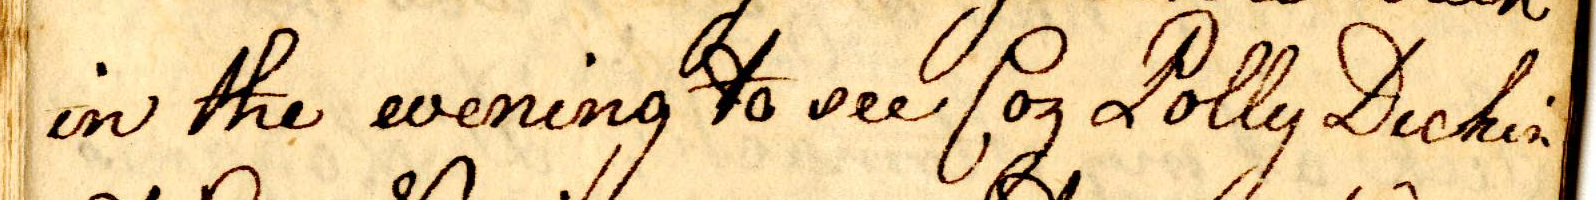in the evening to see Coz Polly Dickin
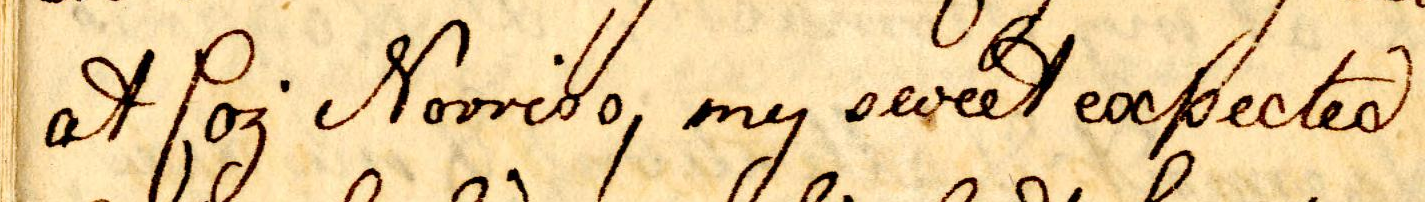at Coz. Norris s, my sweet expected
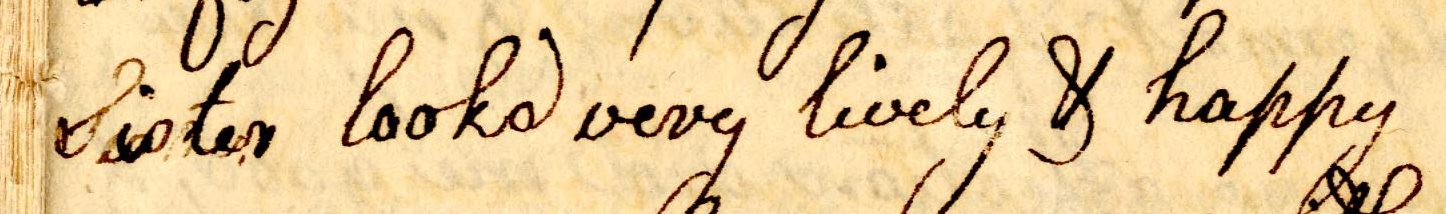Sister lookd very lively & happy
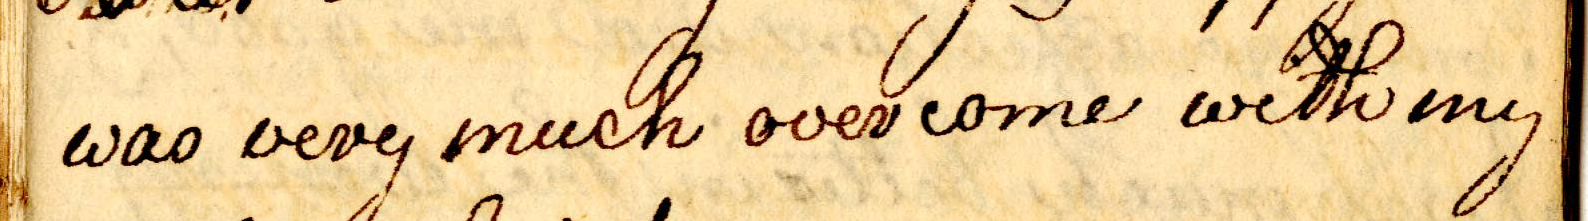was very much over come with my
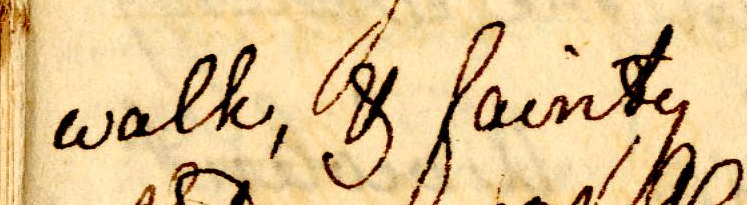walk, & fainty
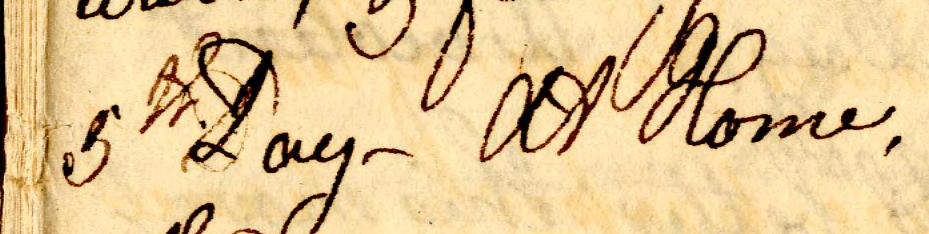5^th Day- At Home,
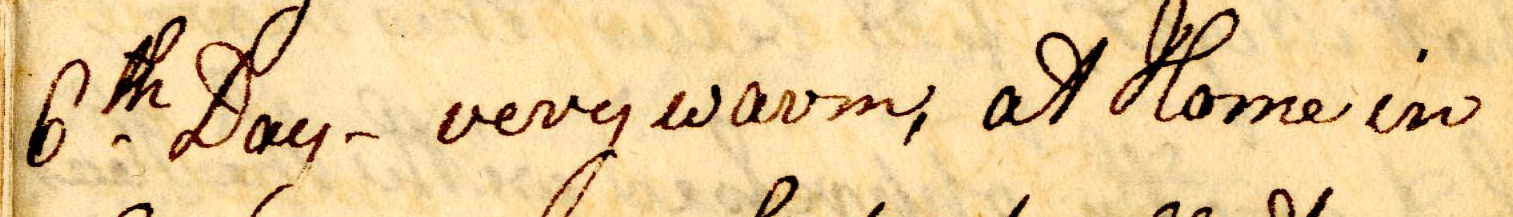6^th Day- very warm, at Home in
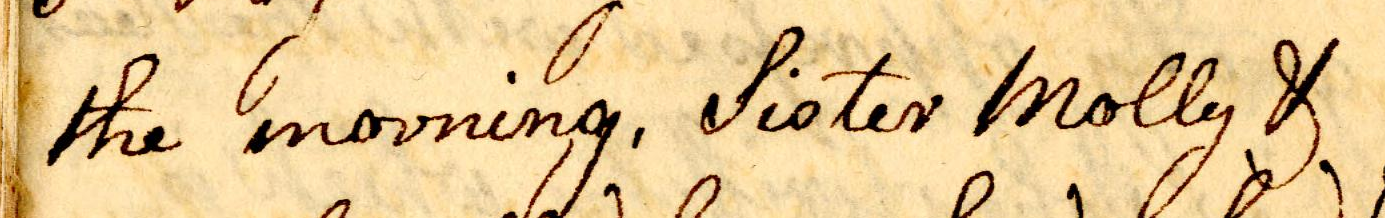the morning, Sister Molly &
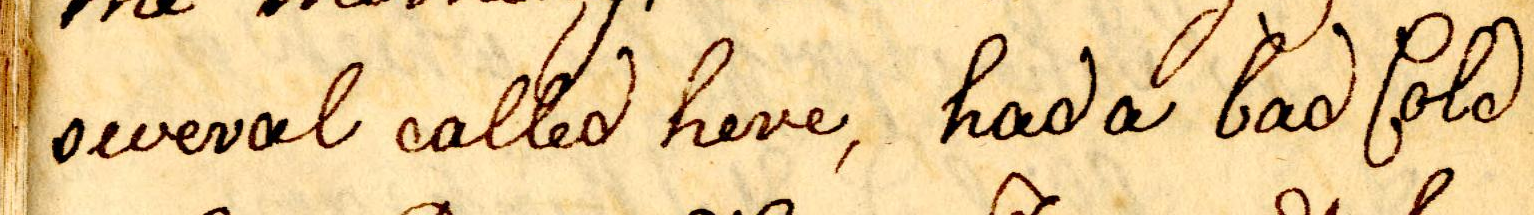several called here, had a bad Cold
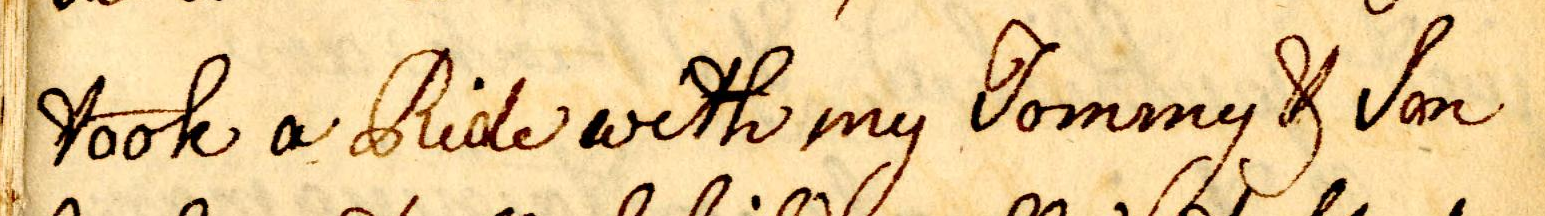took a Ride with my Tommy & Son
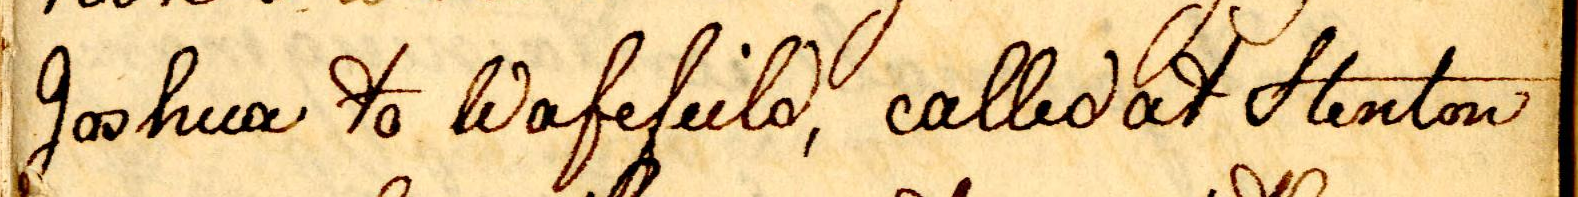Joshua to Wafefeild, called at Stenton
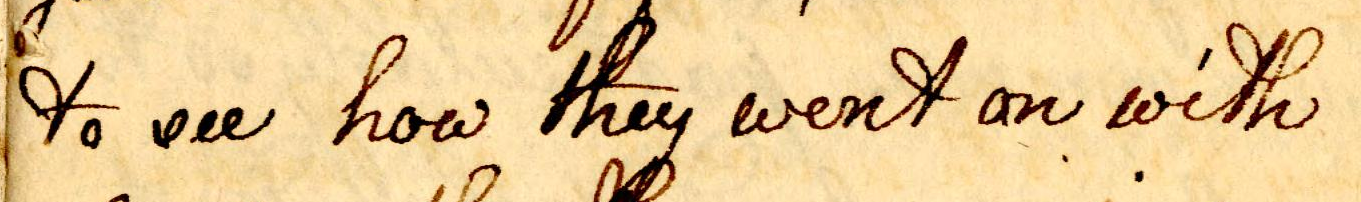to see how they went on with
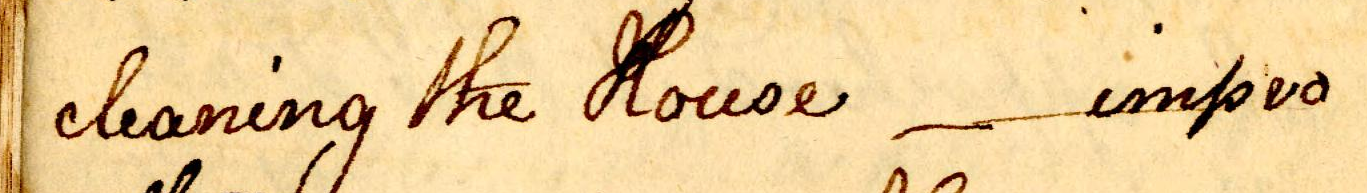cleaning the House- impro
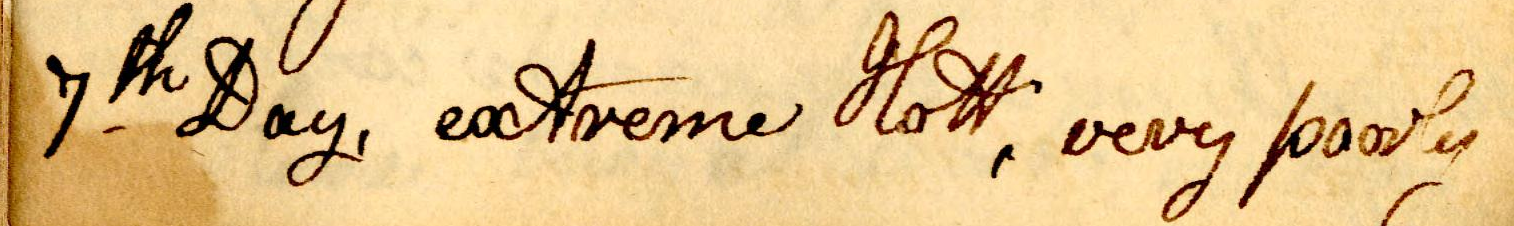7^th Day, extreme Hott, very poorly
